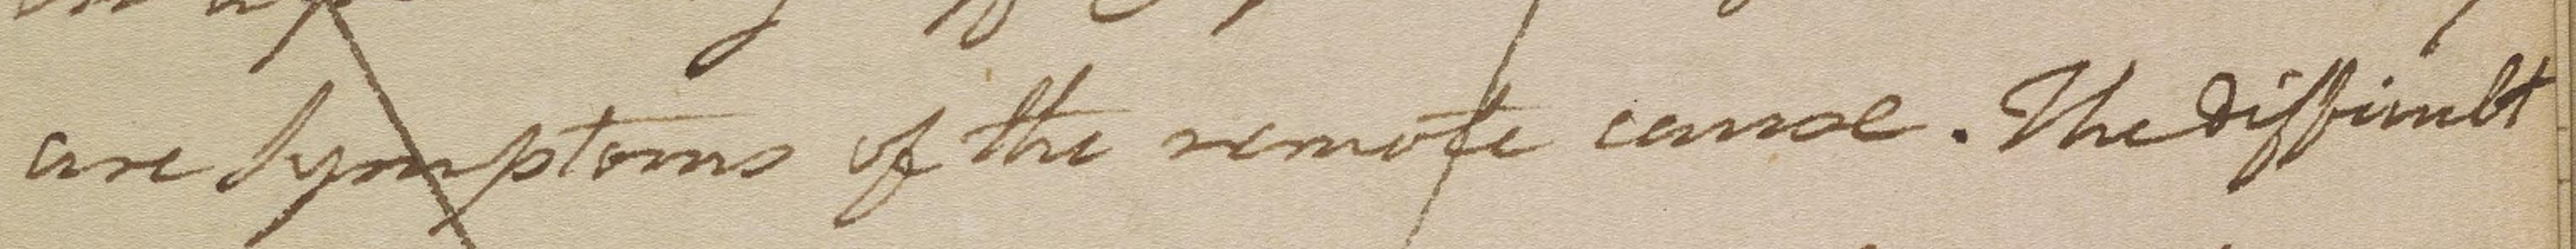are symptoms of the remote cause. The difficult
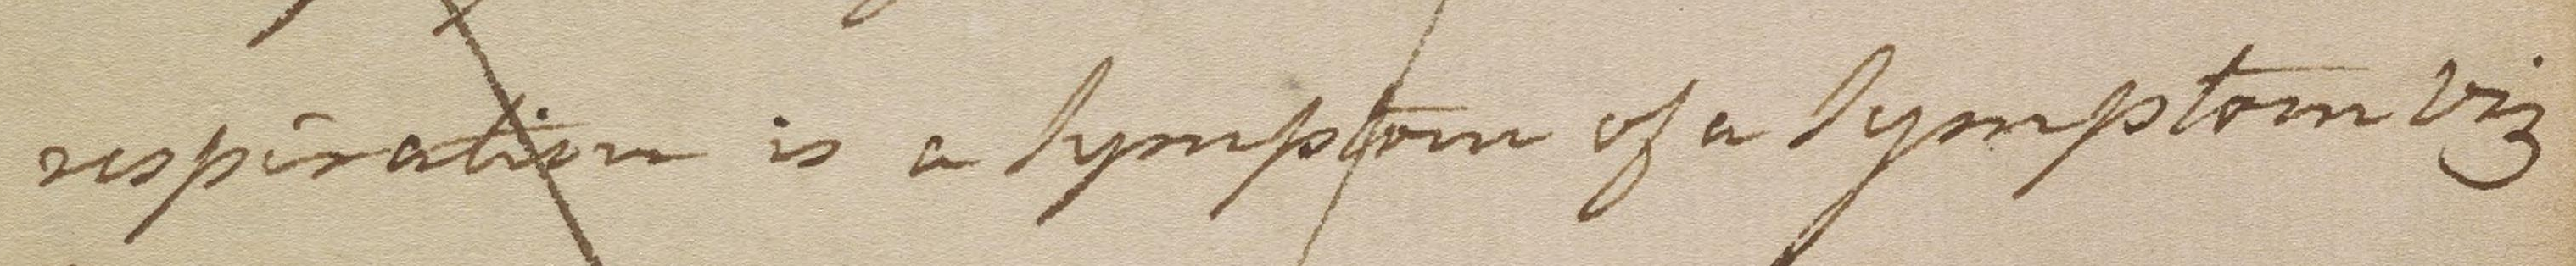respiration is a symptom of a symptom viz.
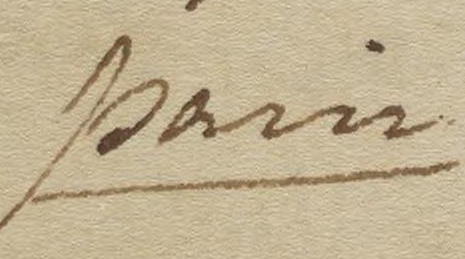pain.
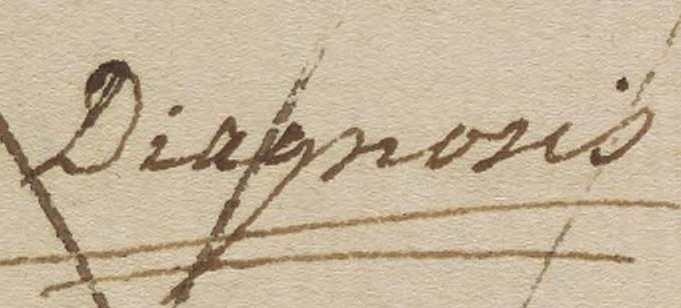Diagnosis
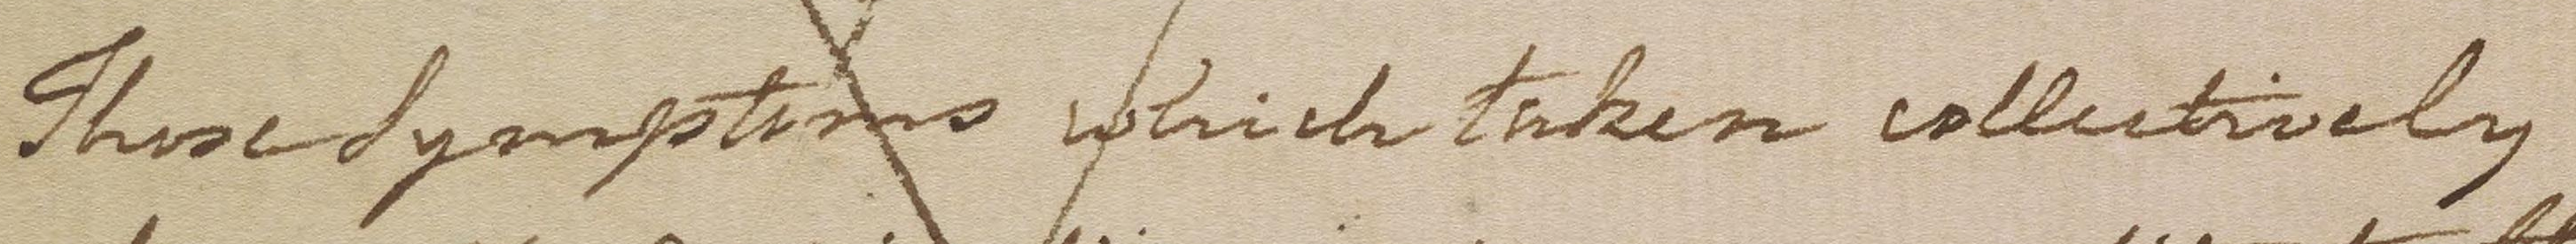These symptoms which taken collectively
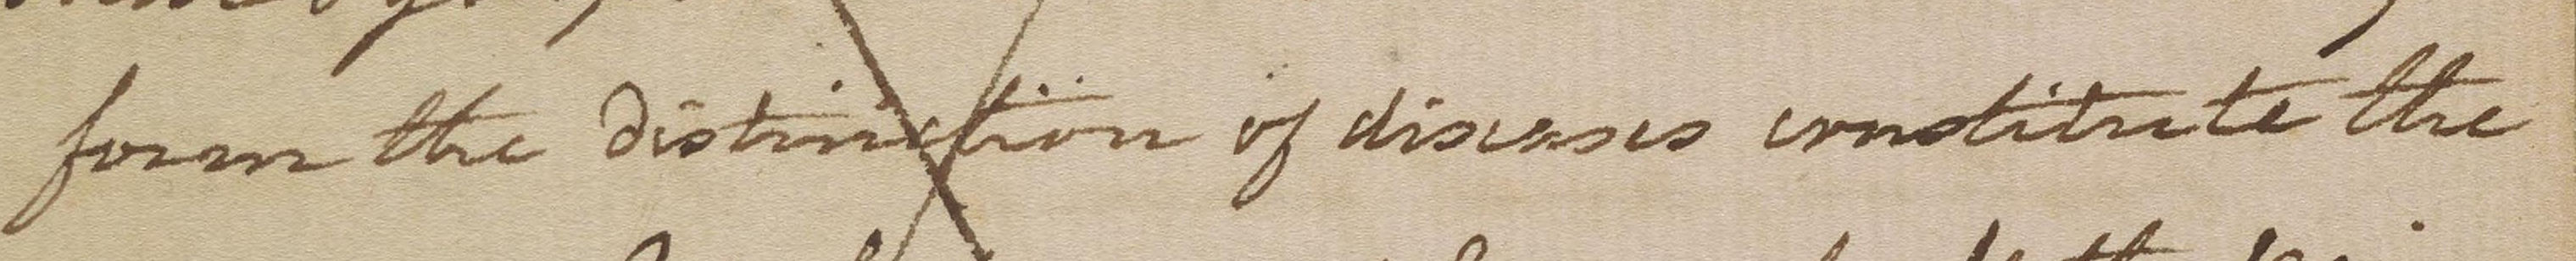form the distrination of diseases constitute the
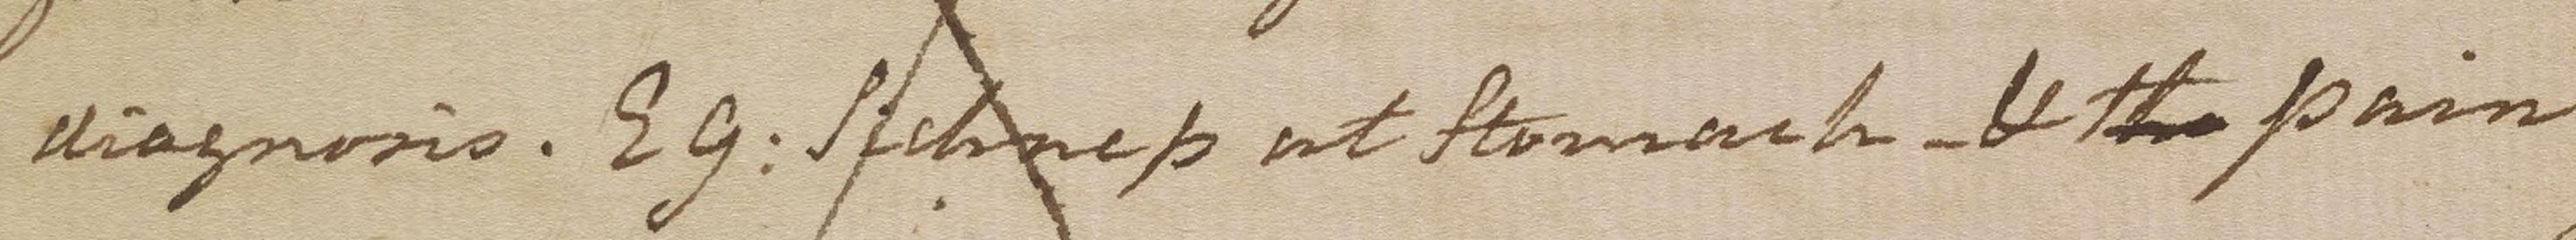diagnosis. E.g: sichnap at stomach, & the pain
